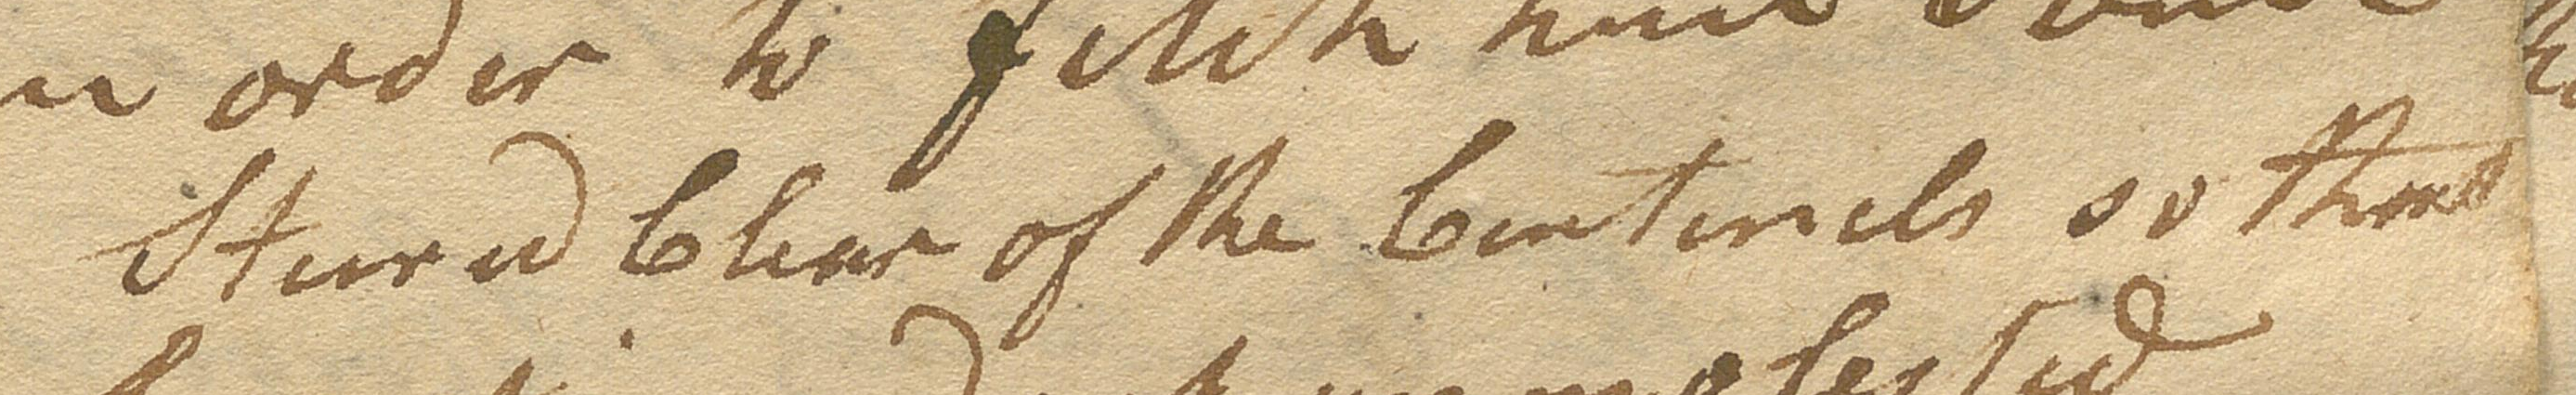Steered Clear of the Centinels so then
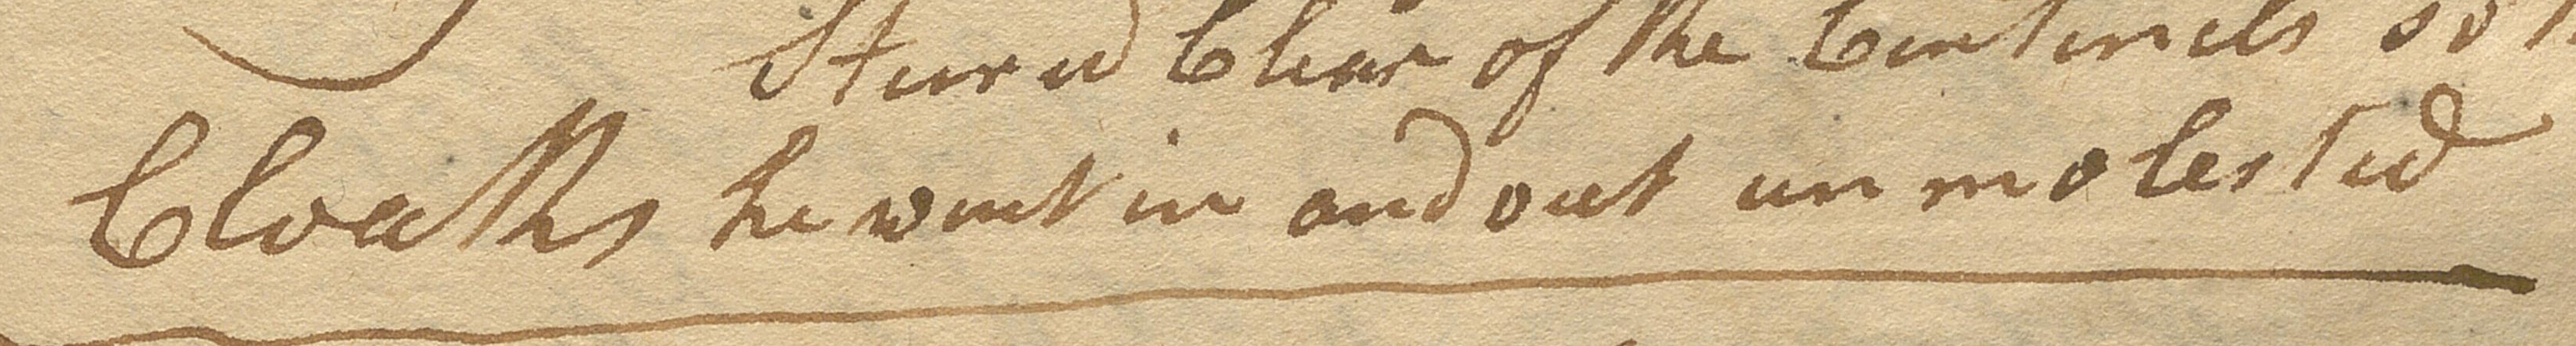Cloaths he went in and out unmolested
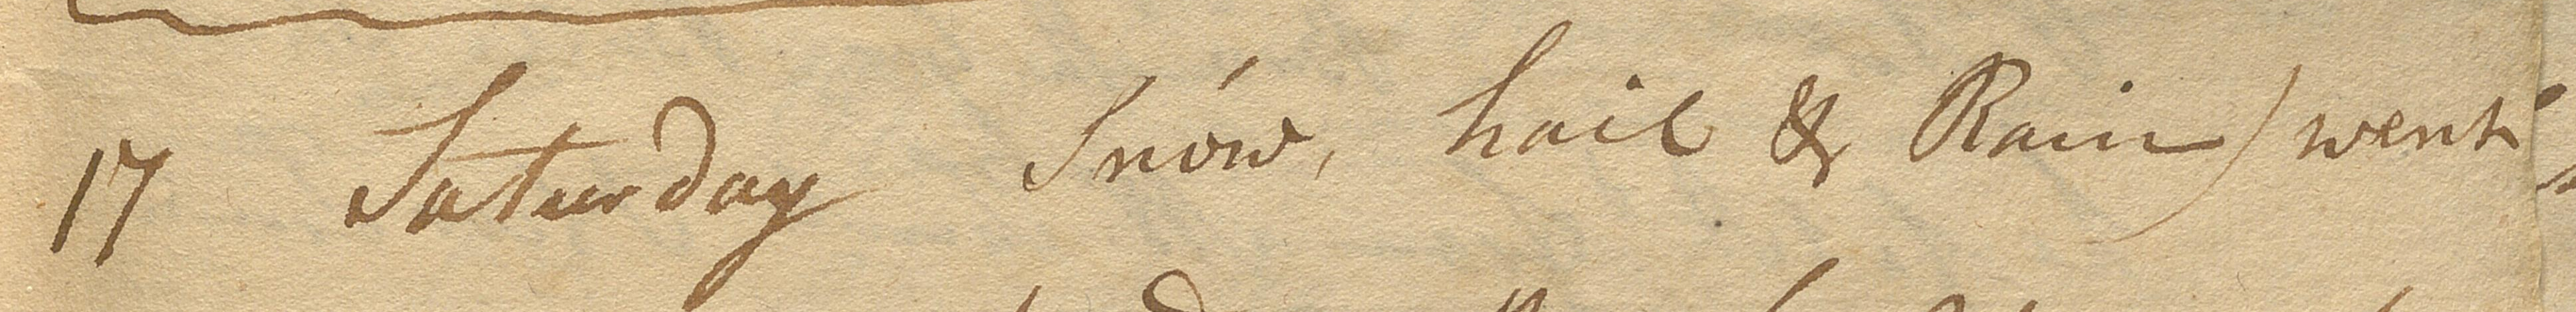17 Saturday Snow, hail & Rain) went
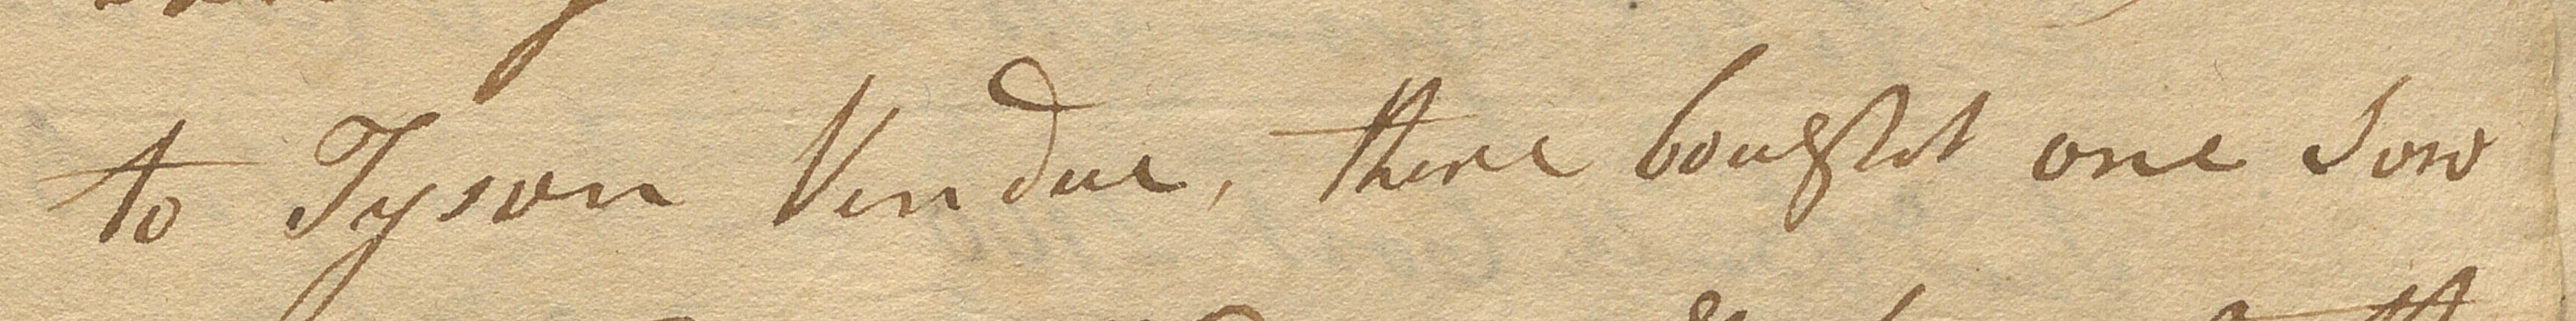to Tyson Vendue, there bought one Sow
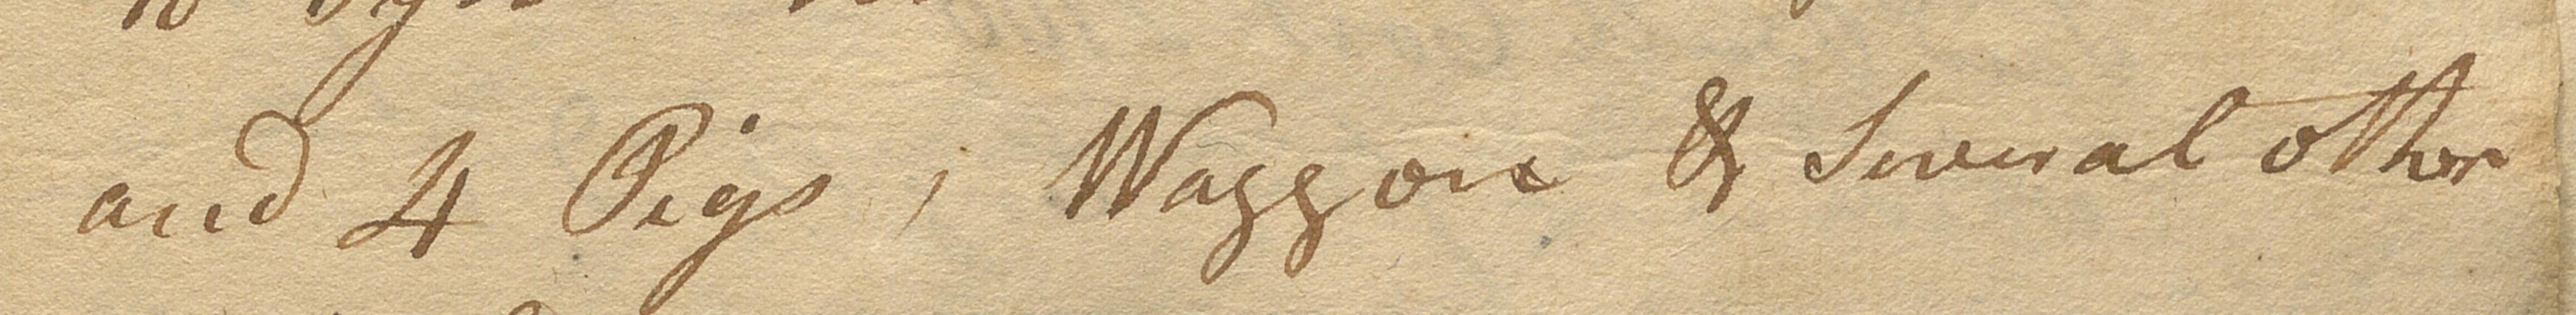and 4 Pigs, Waggon & Several other
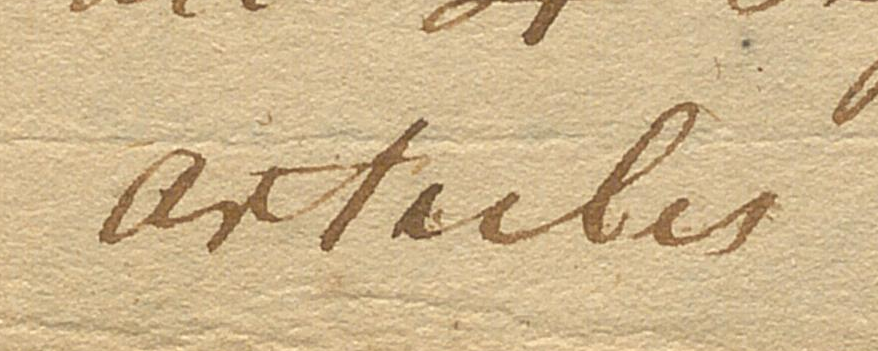Articles
